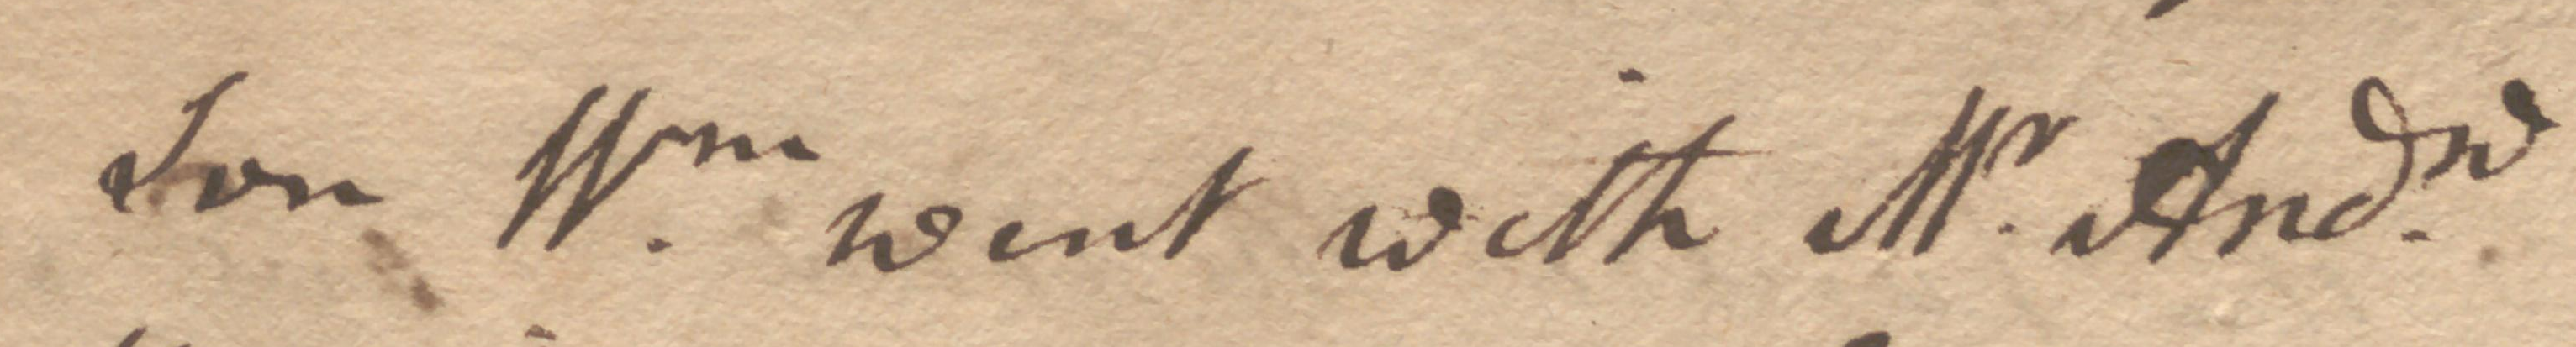Son W^m. went with M^r. And^w.
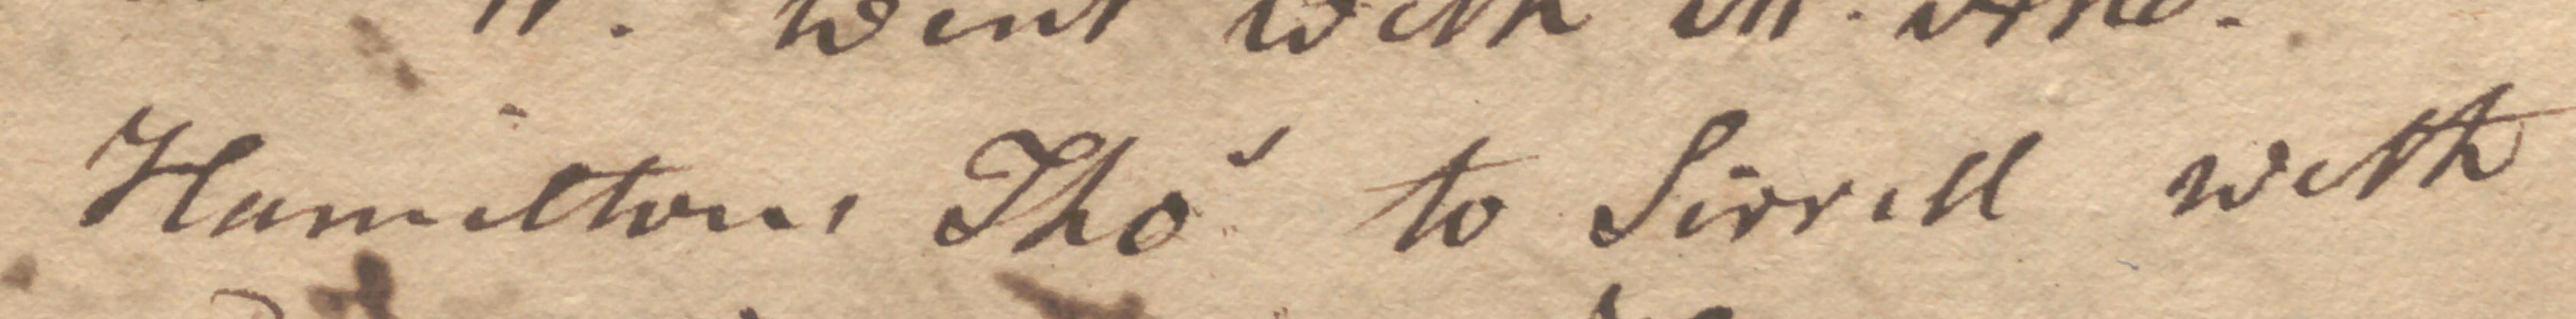Hamiltons Tho^s to Sirrell with
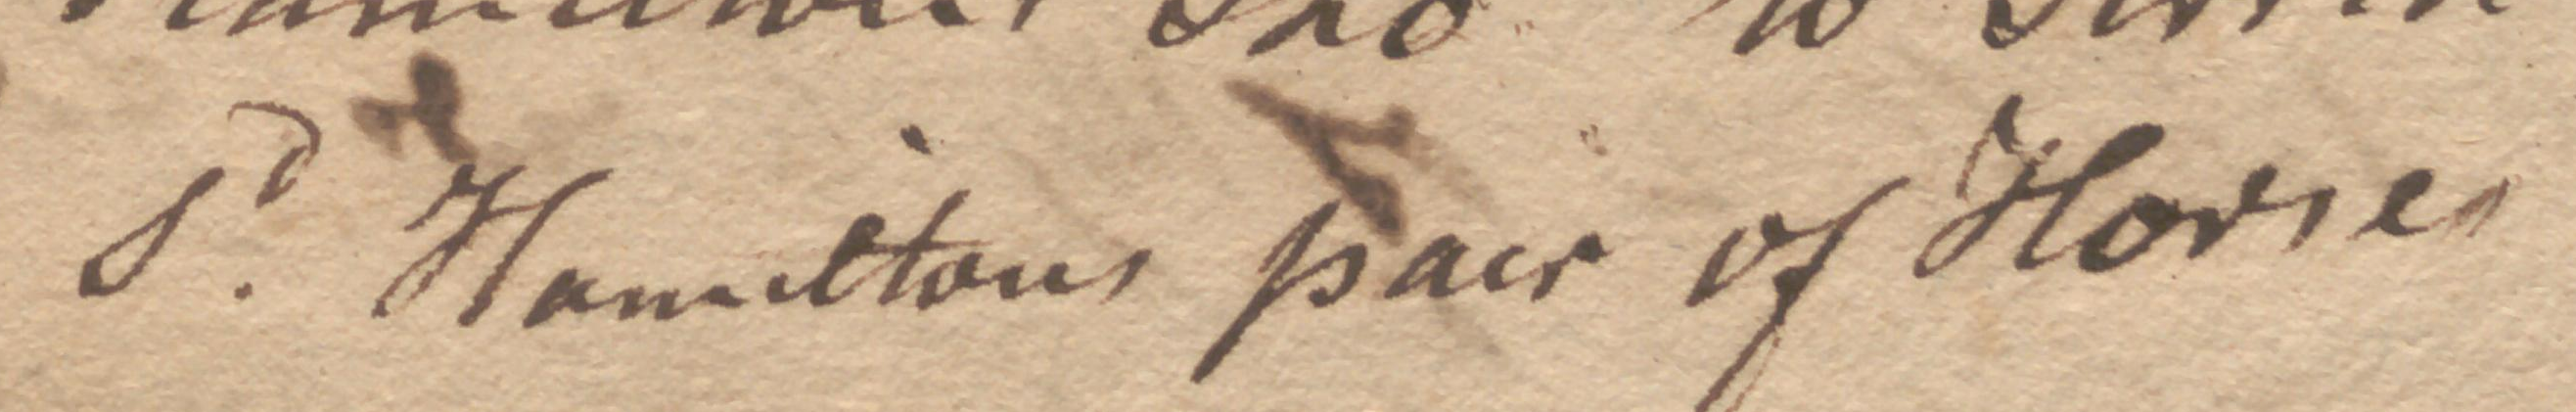s^d. Hamiltons pair of Horses
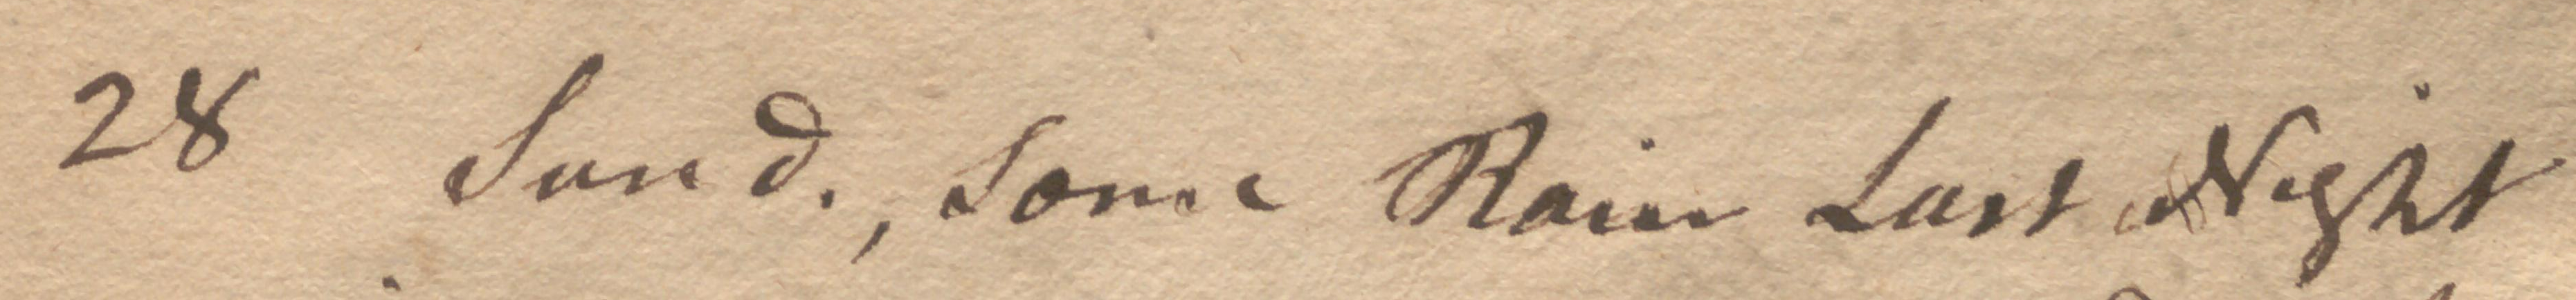28 Sund., some Rain Last Night
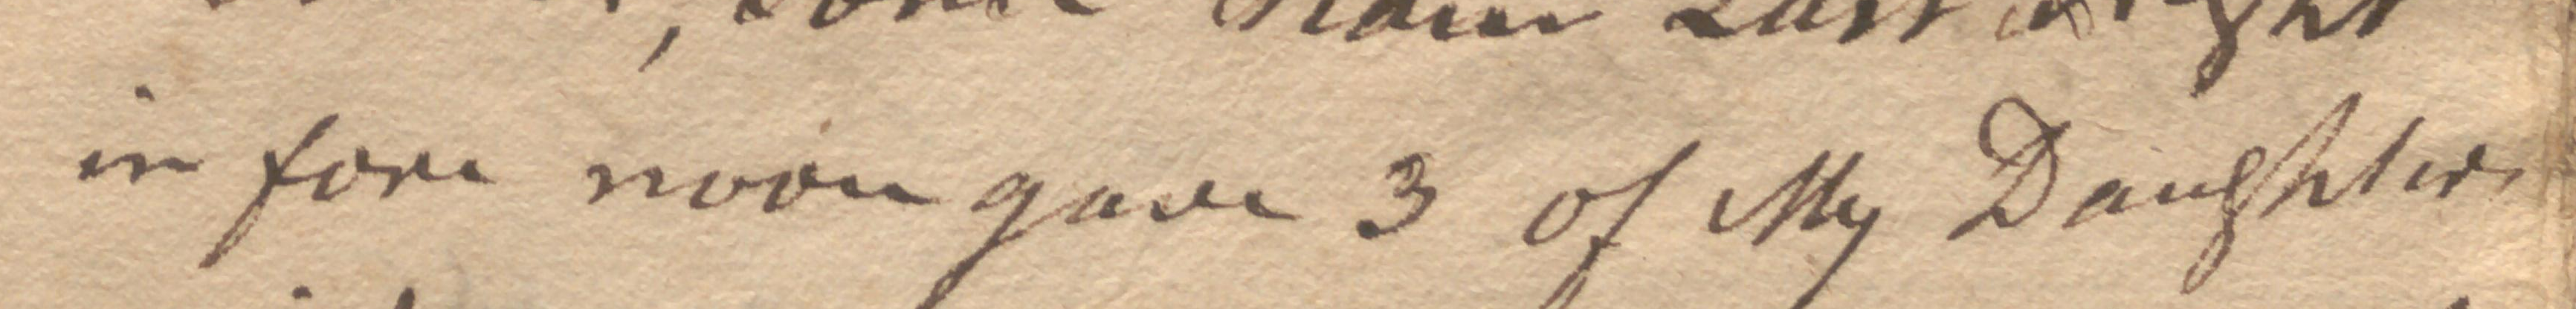in fore noon gave 3 of My Daughters
